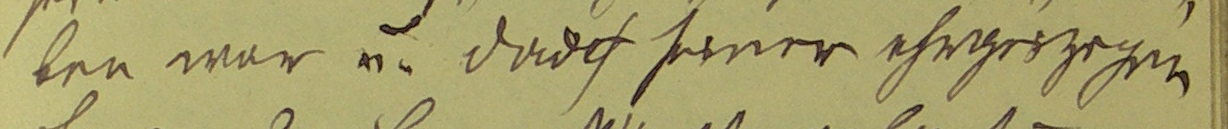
ben war und dadurch seiner ehrgeizigen
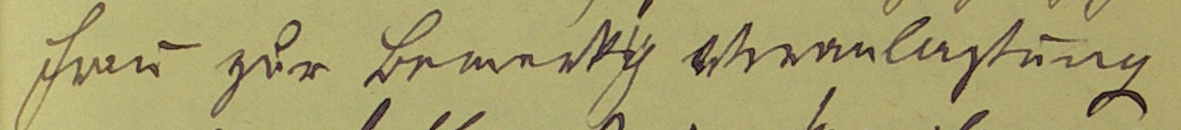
Frau zur Bemerkung Veranlaßung
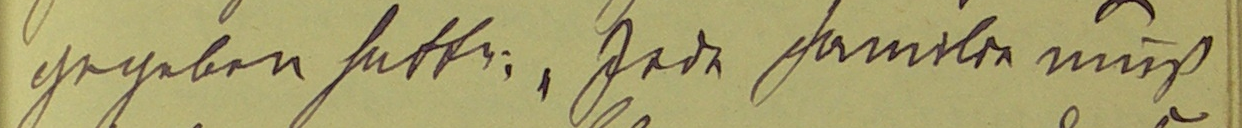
gegeben hatte:“ Jede Familie muß
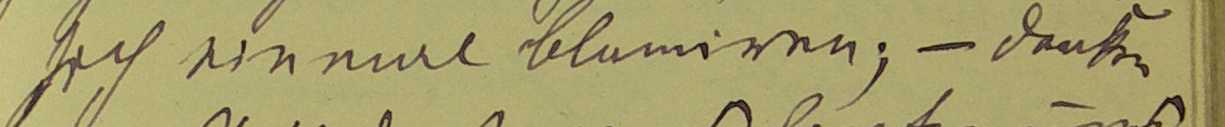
sich einmal blamieren- danken
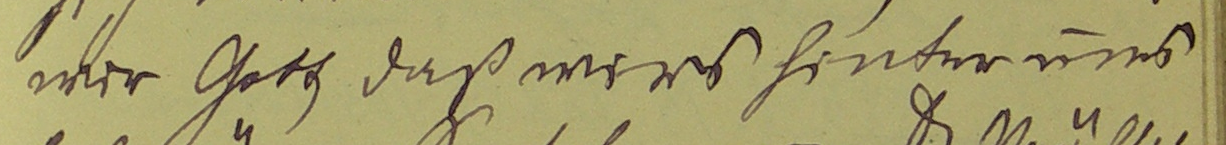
wir Gott das wir es hinter uns
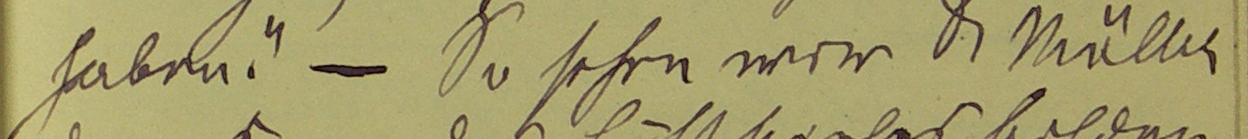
haben.“ So sehr war Dr. Miller
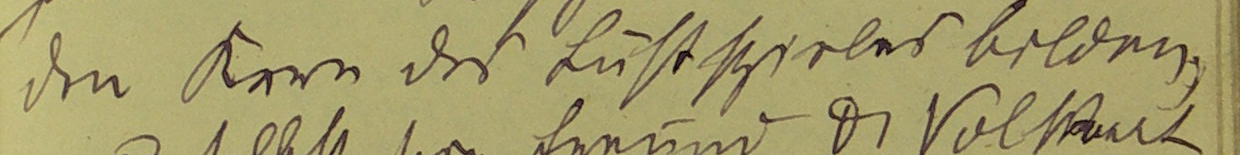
der Kern des Lustspieles bildung
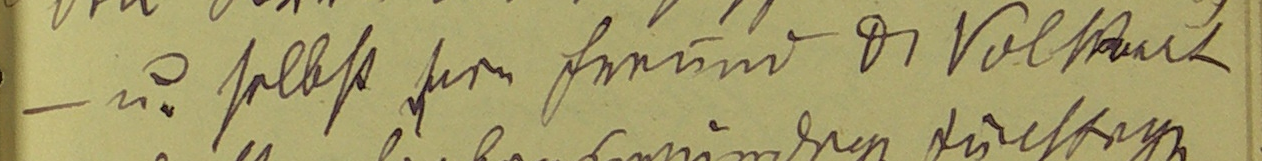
—und selbst sein Freund Dr. Volkarth
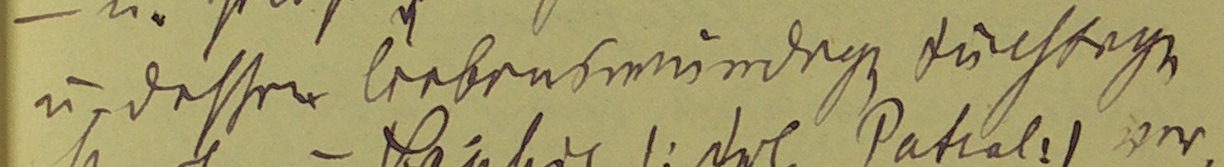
und dessen liebenswürdige, tüchtige
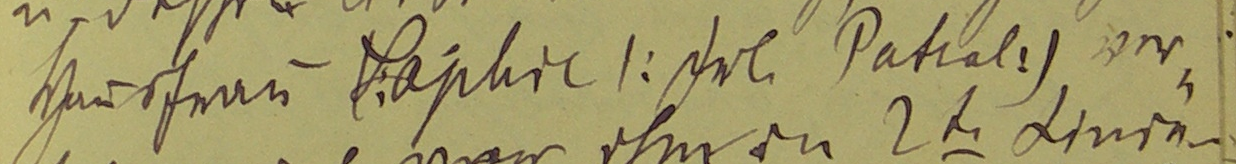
Hausfrau Liaphie ( : Frl. Patial : ) ver¬
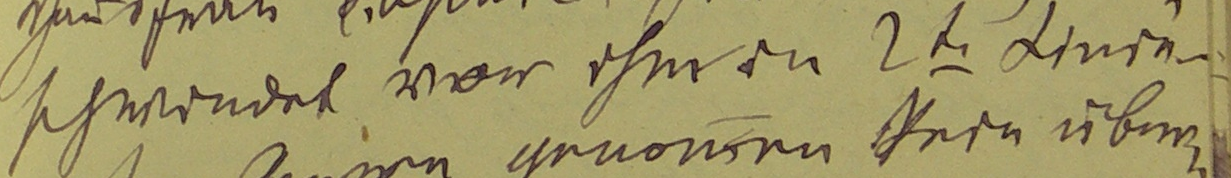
schwindet vor ihm in 2-te Linie.
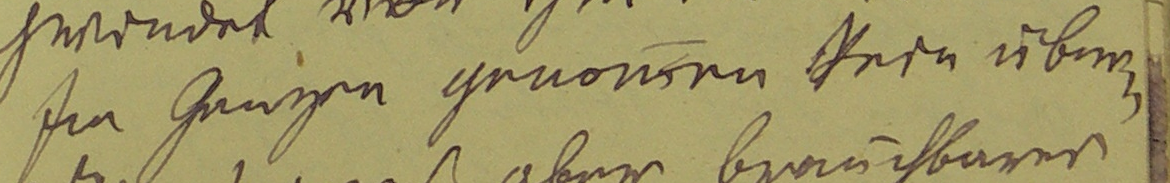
Im Ganzen genommen kein über¬
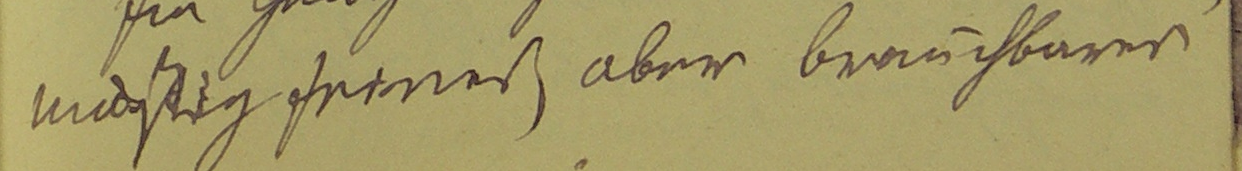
mäßig feines aber brauchbares
